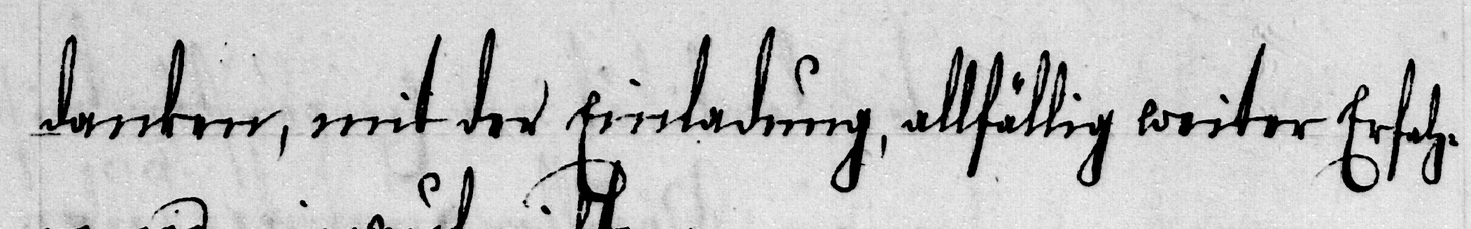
danken, mit der Einladung, allfällig weiter Erfah¬
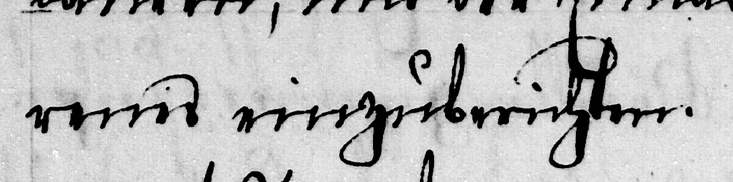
renes einzuberichten.
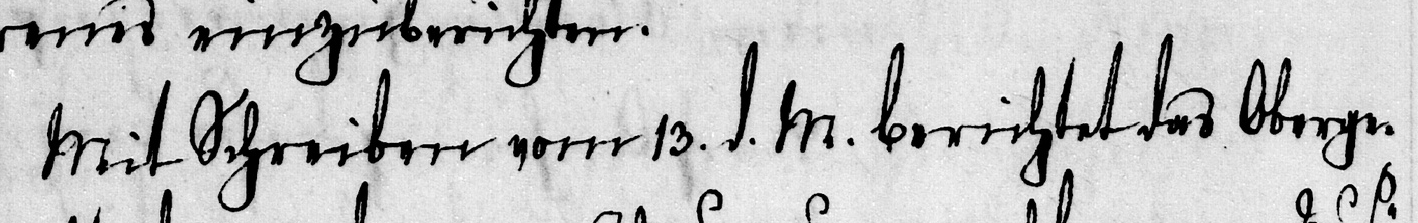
Mit Schreiben vom 13. d. M. berichtet das Oberge¬
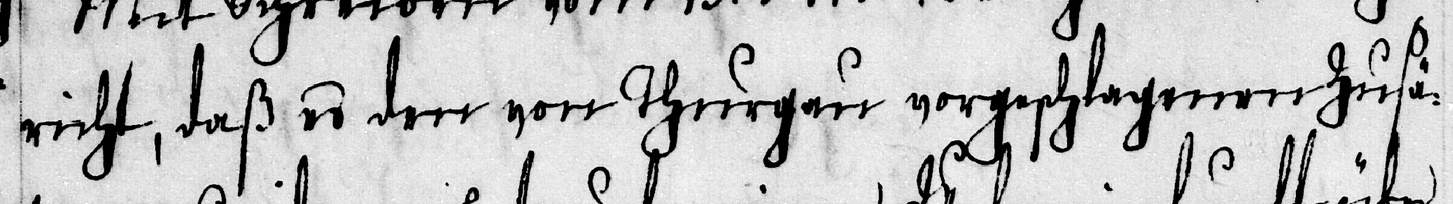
richt, daß es den von Thurgau vorgeschlagenen Zusä¬
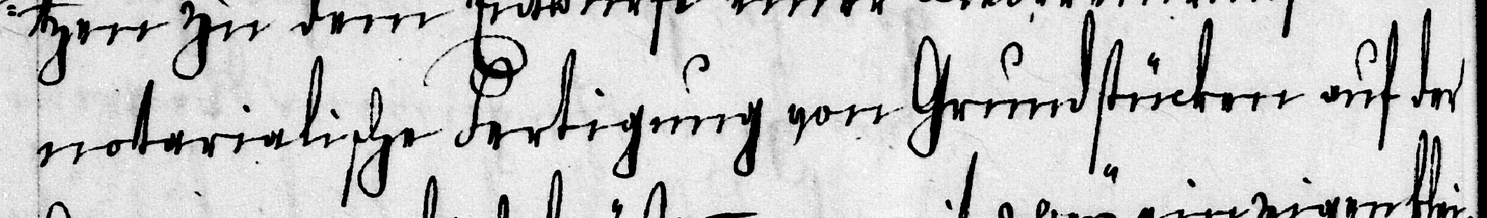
notarialische Fertigung von Grundstücken auf der
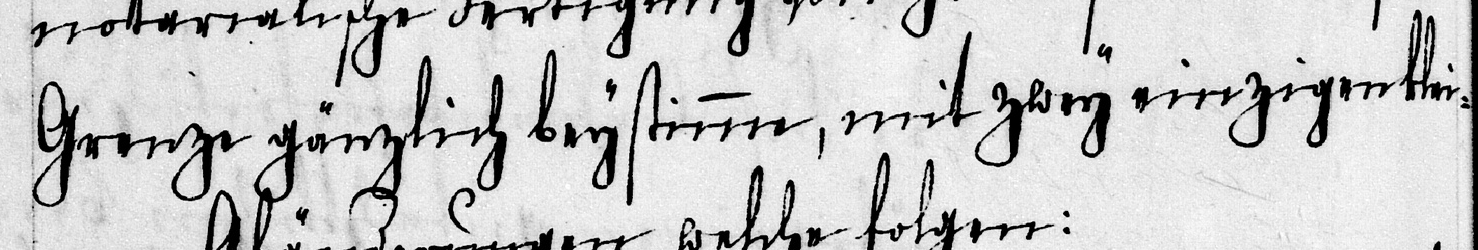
Grenze gänzlich beystimme, mit zwey einzigen kle¬
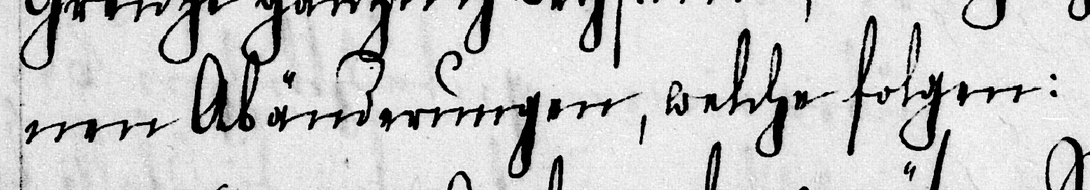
inen Abänderungen, welche folgen:
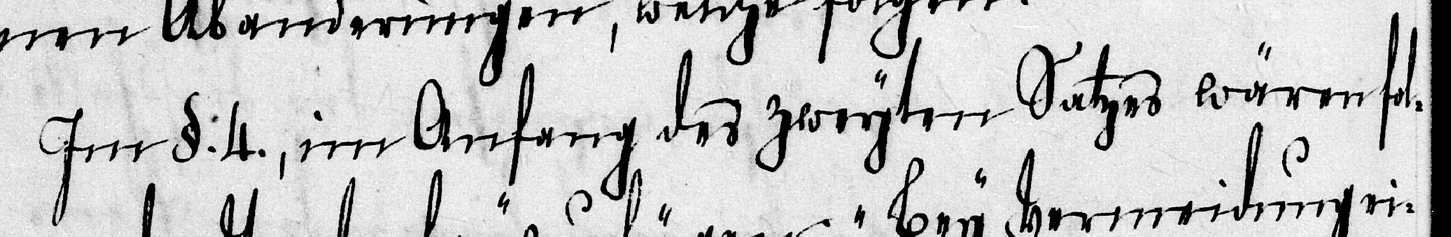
Im §. 4., im Anfang des zweyten Satzes wären fol¬
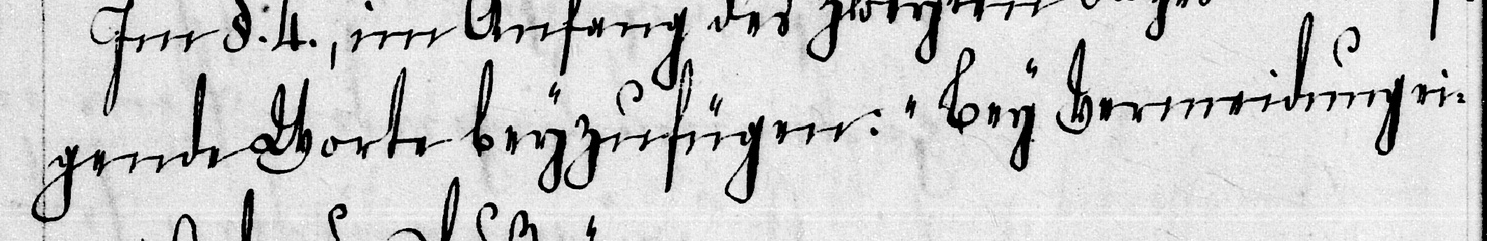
gende Worte beyzufügen: „bey Vermeidung ei¬
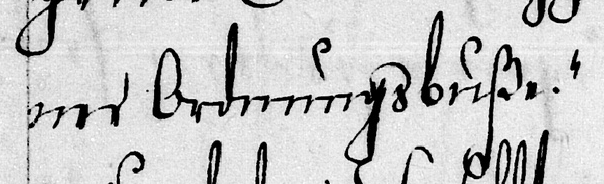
ner Ordnungsbuße.“
